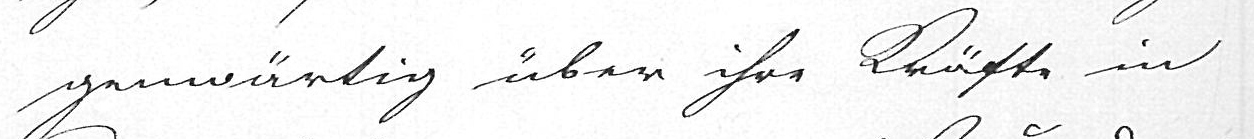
genwärtig über ihre Kräfte in
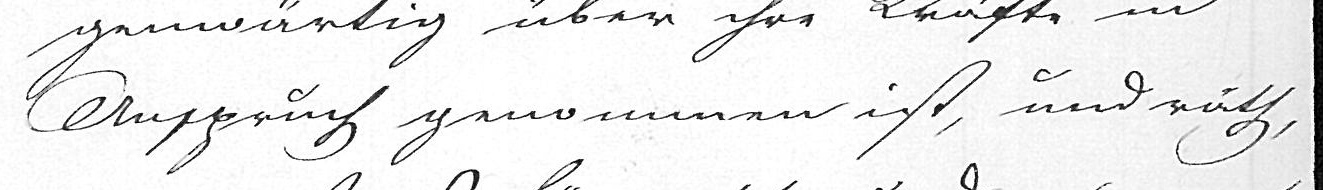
Anspruch genommen ist, und räth,
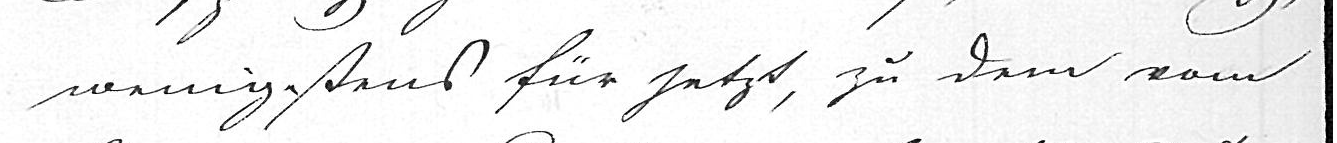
wenigstens für jetzt, zu dem vom
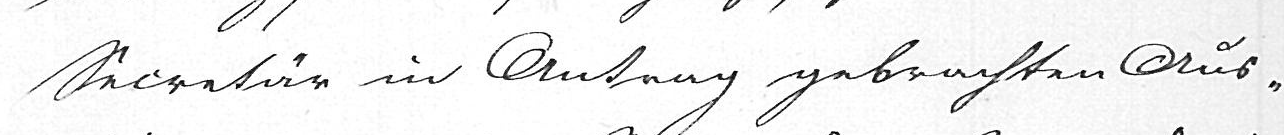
Secretär in Antrag gebrachten Aus-
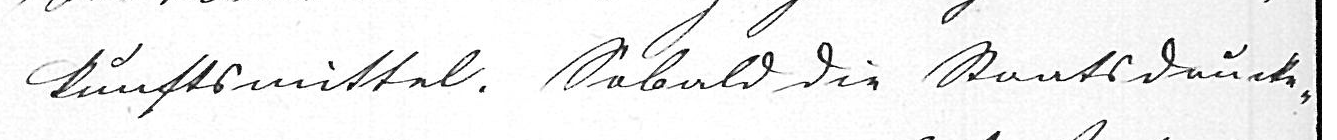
kunftsmittel. Sobald die Staatsdruck-
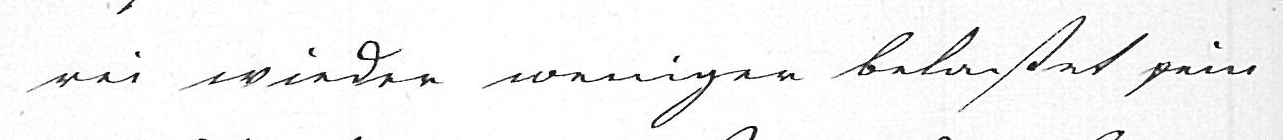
ren wieder weniger belastet sein
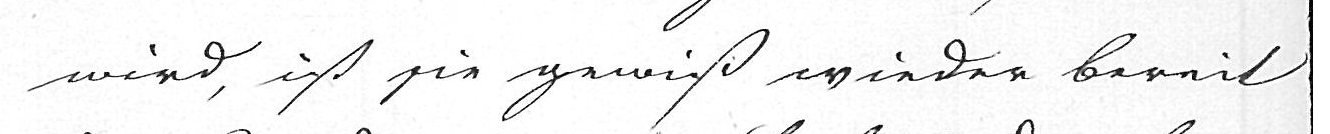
wird, ist sie gewiß wieder bereit
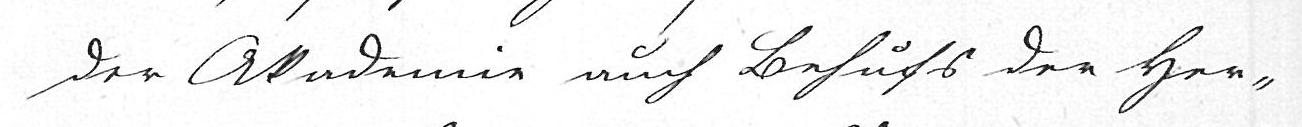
der Akademie auch Behufs der Her-
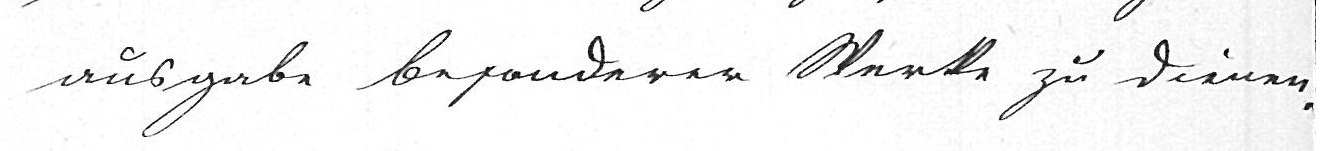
ausgabe besonderer Werke zu dienen.
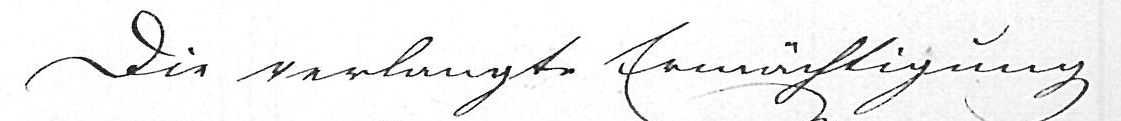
Die verlangte Ermächtigung
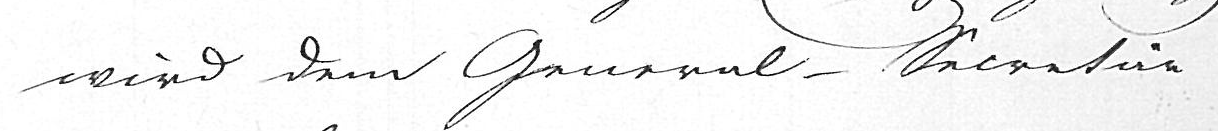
wird dem General-Secretär
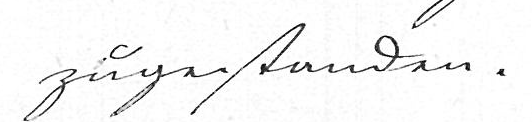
zugestanden.
